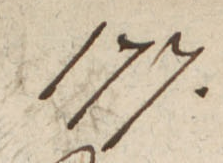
177.
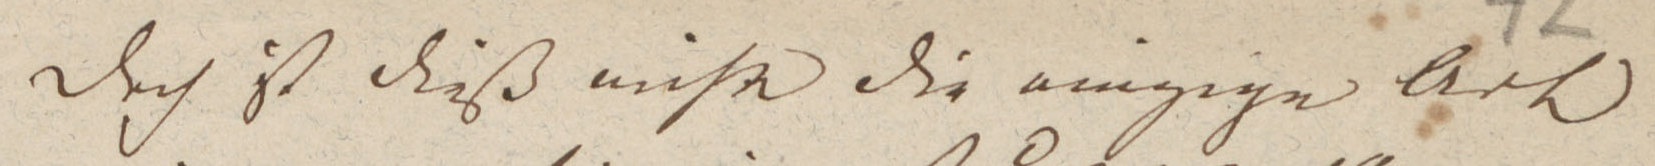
Doch ist diess nicht die einzige Art
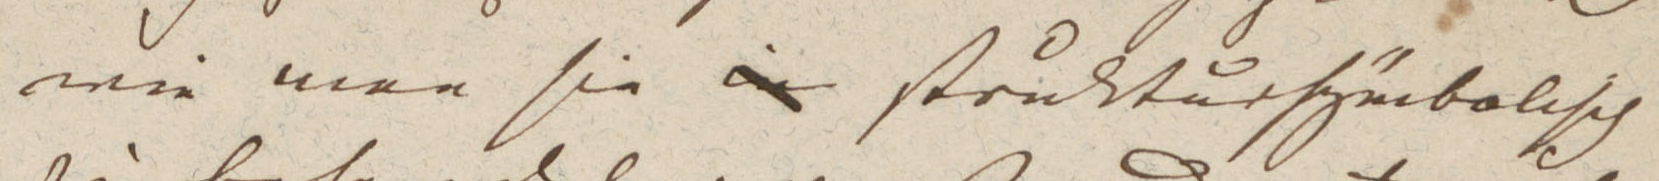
wie man sie in struktursymbolisch
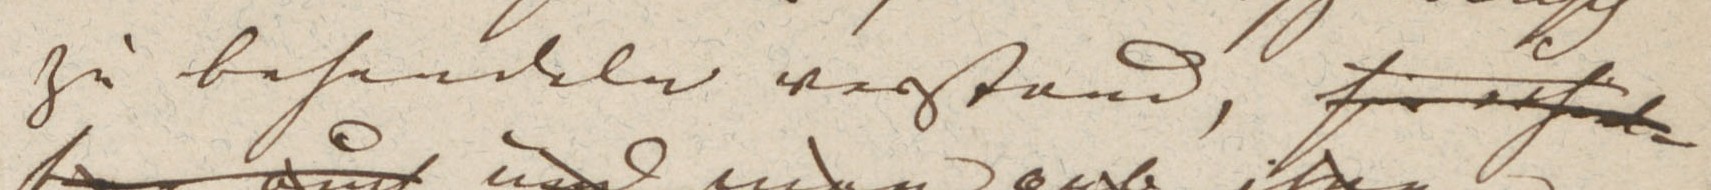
zu behandeln verstand, sie erhiel-
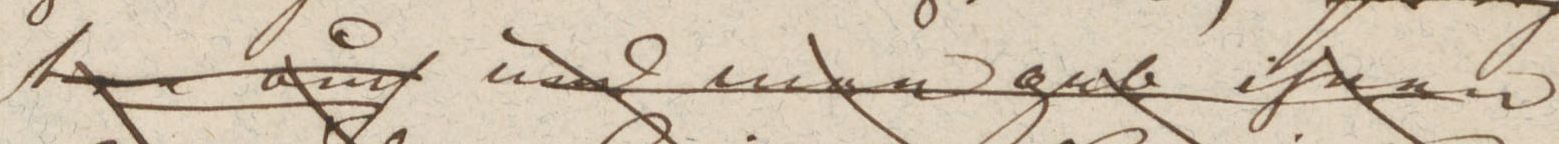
ten auch und man gab ihnen
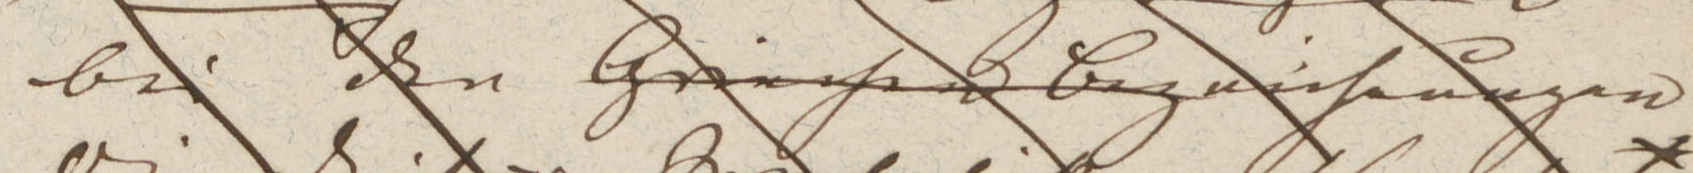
bei den Griechen Bezeichnungen
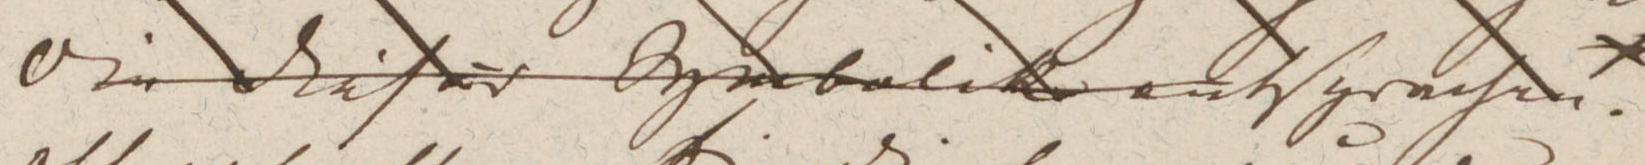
die dieser Symbolik entsprachen. %
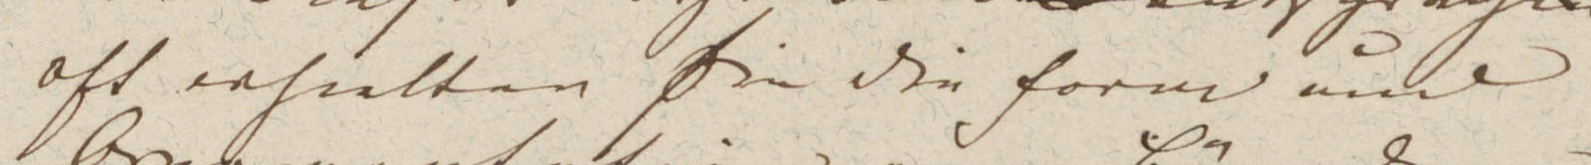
oft erhielten Ssie die Form und
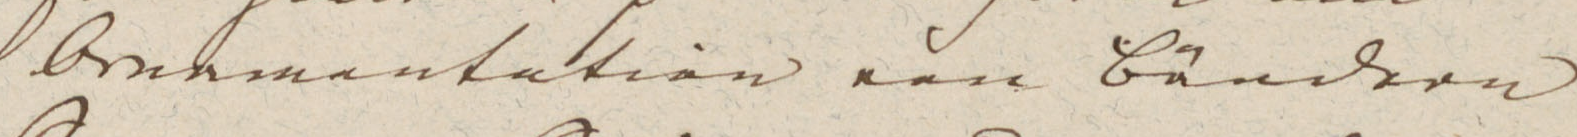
Ornamentation von Bändern
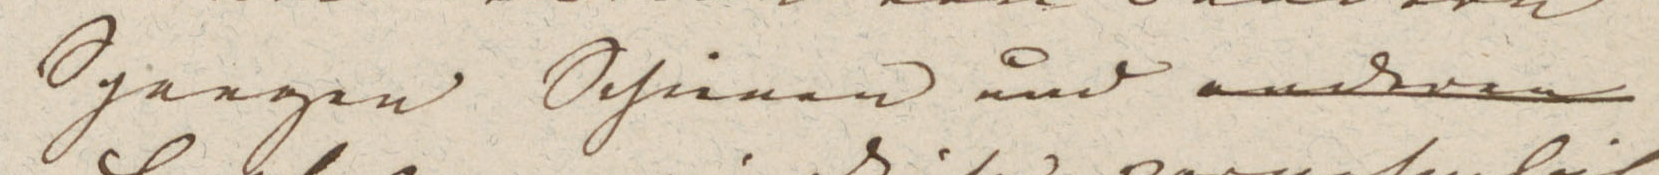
Spangen Schienen und anderen
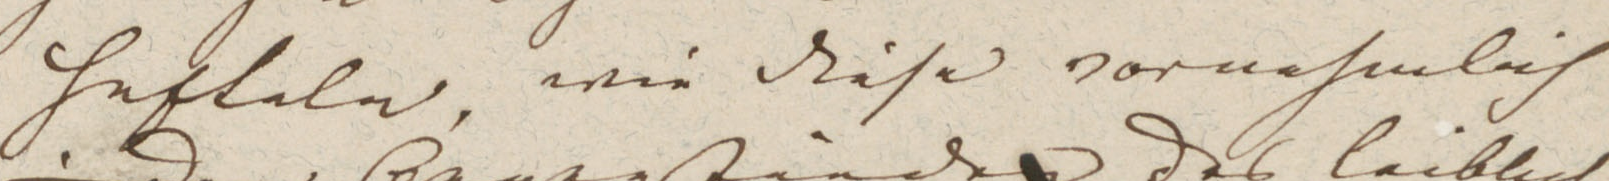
Hefteln, wie diese vornehmlich
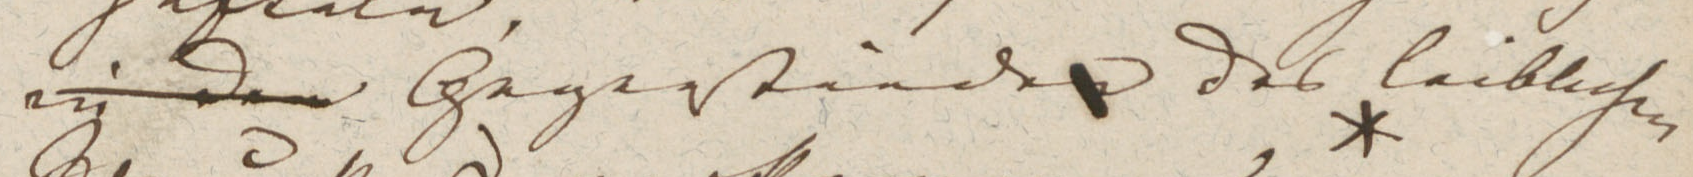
in den Gegenständen des leiblichen
